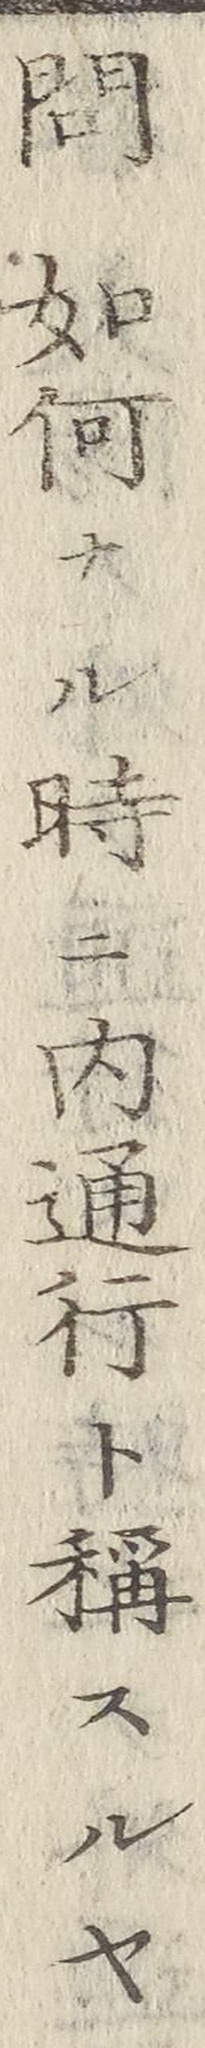問如何ナル時ニ内通行ト称スルヤ
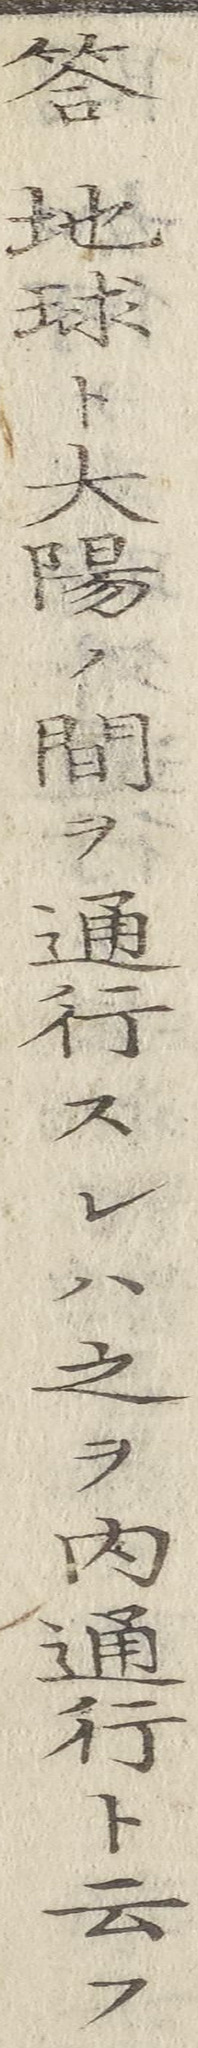答地球ト大陽ノ間ヲ通行スレハ之ヲ内通行ト云フ
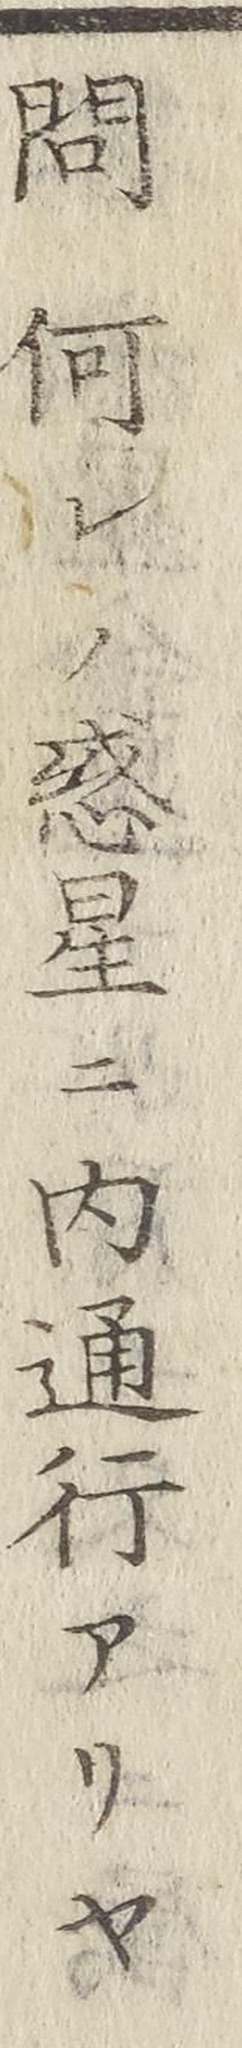問何レノ惑星ニ内通行アリヤ

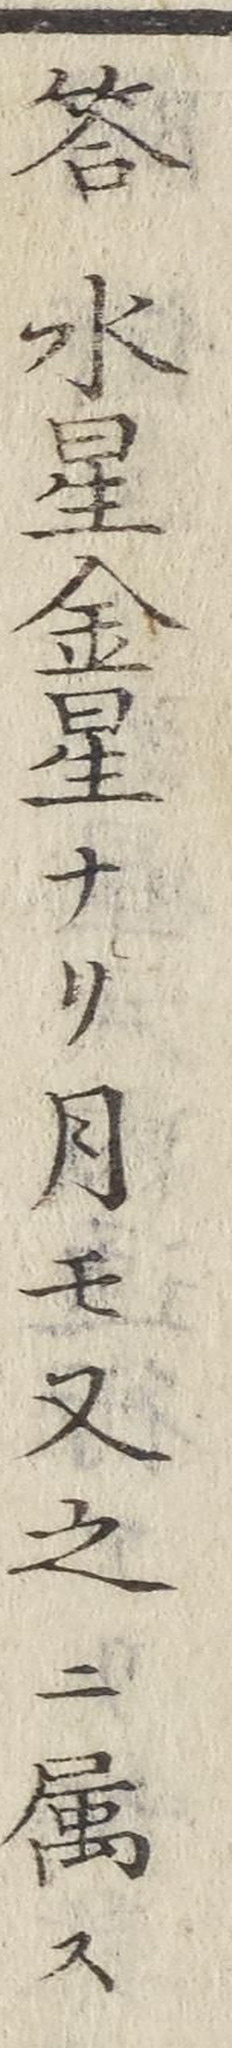答水星金星ナリ月モ又之ニ属ス
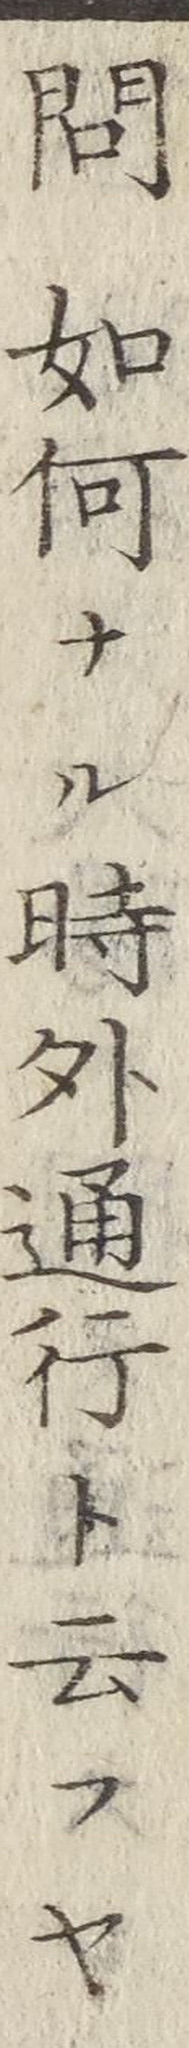問如何ナル時外通行ト云フヤ
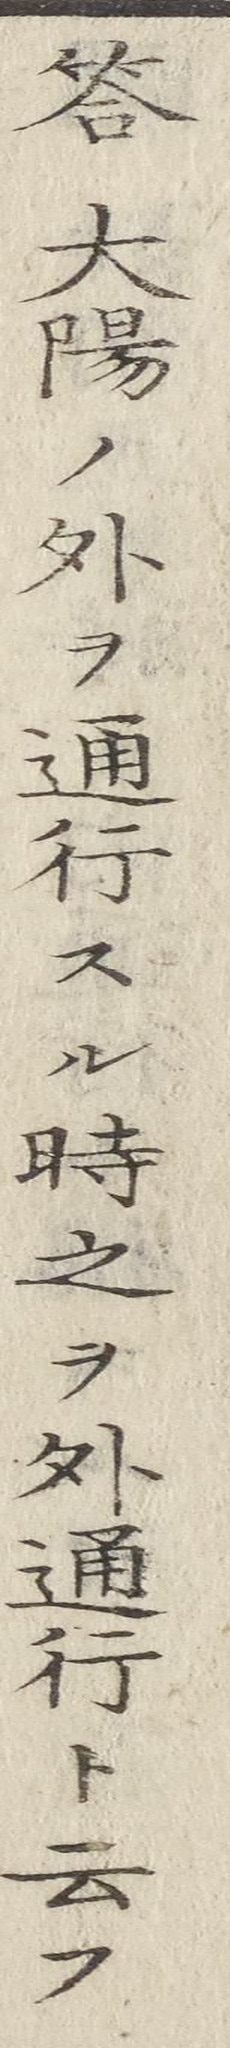答大陽ノ外ヲ通行スル時之ヲ外通行ト云フ
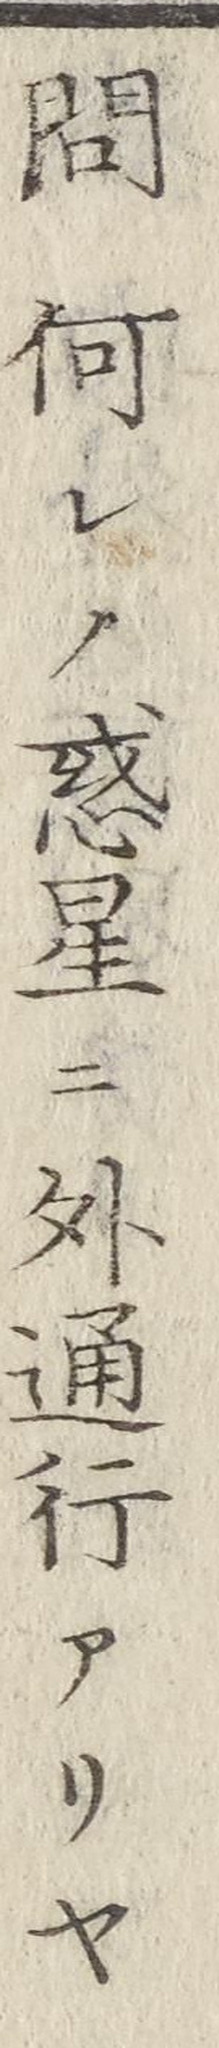問何レノ惑星ニ外通行アリヤ
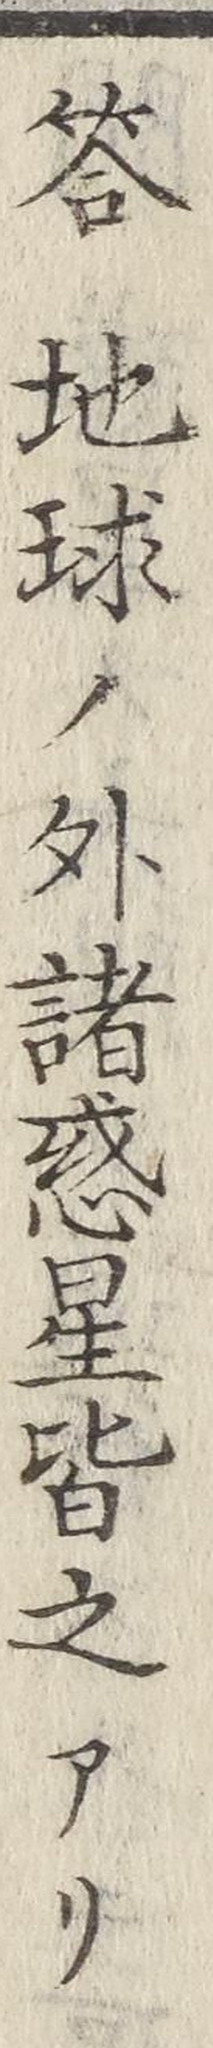答地球ノ外諸惑星皆之アリ
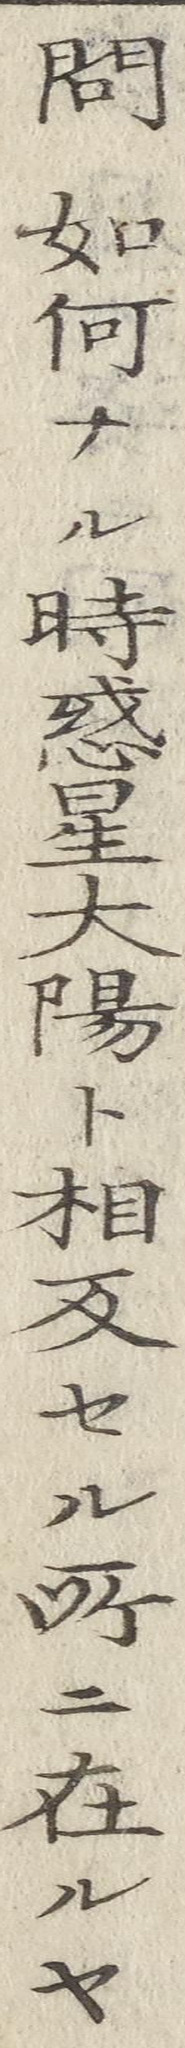問如何ナル時惑星大陽ト相反セル所ニ在ルヤ
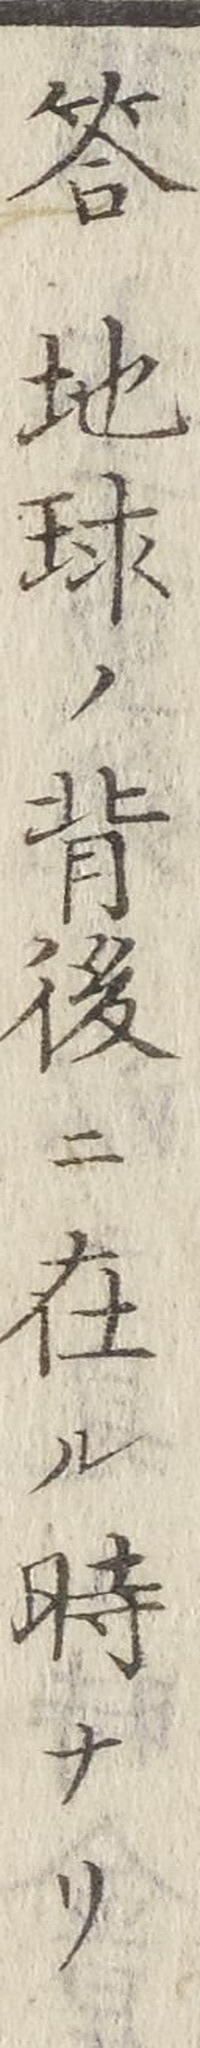答地球ノ背後ニ在ル時ナリ
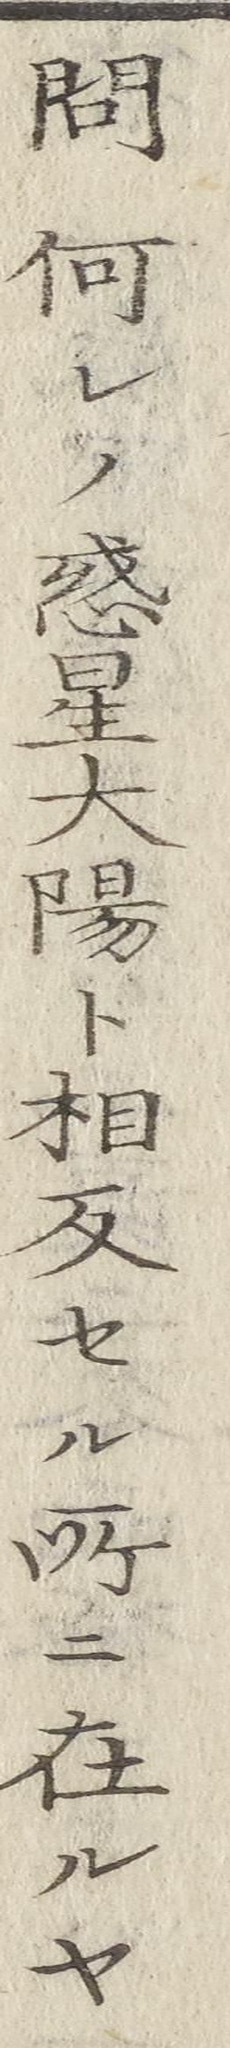問何レノ惑星大陽ト相反セル所ニ在ルヤ
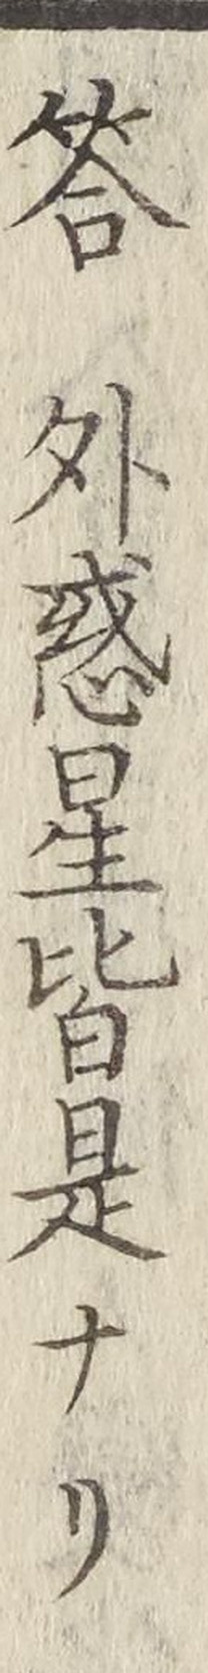答外惑星皆是ナリ
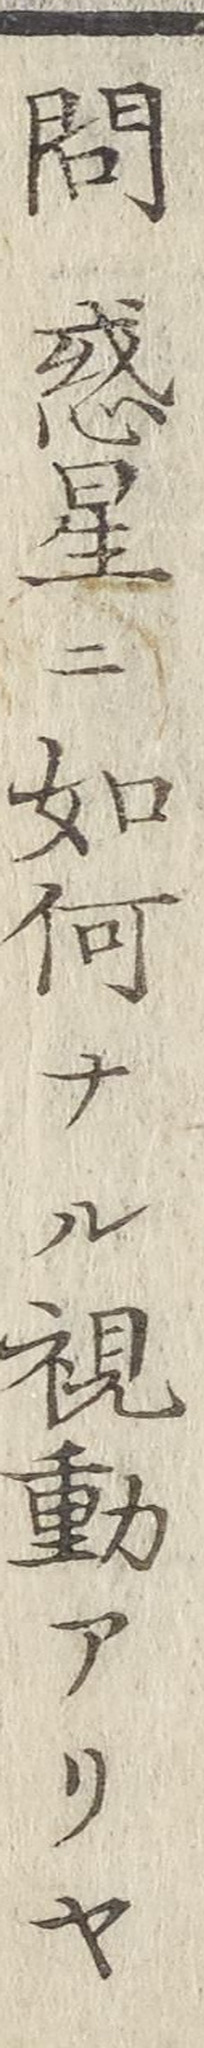問惑星ニ如何ナル視動アリヤ
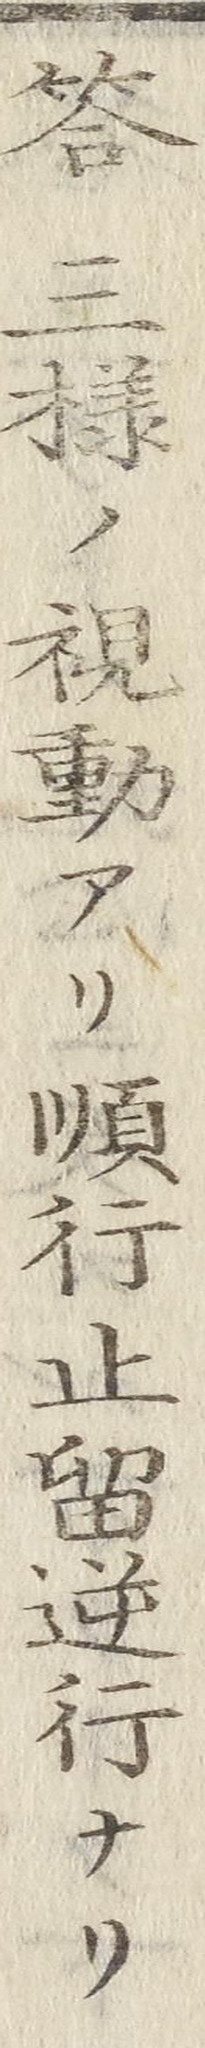答三様ノ視動アリ順行止留逆行ナリ
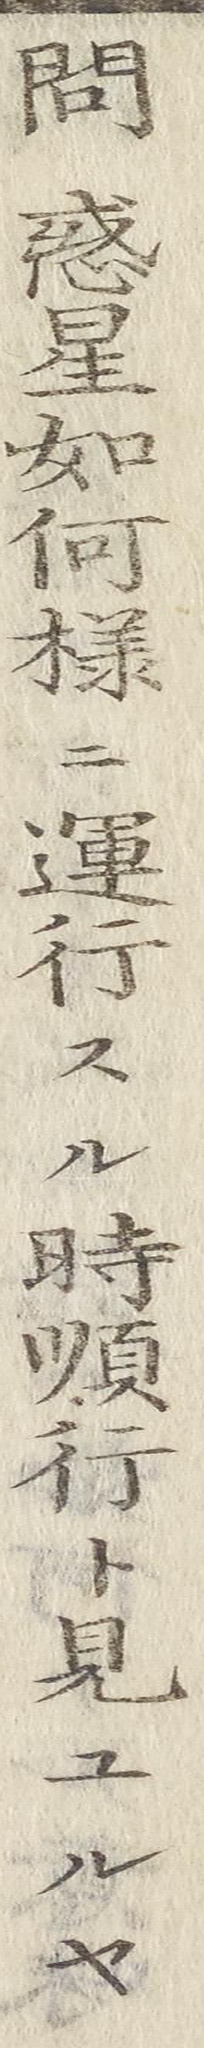問惑星如何様ニ運行スル時順行ト見ユルヤ
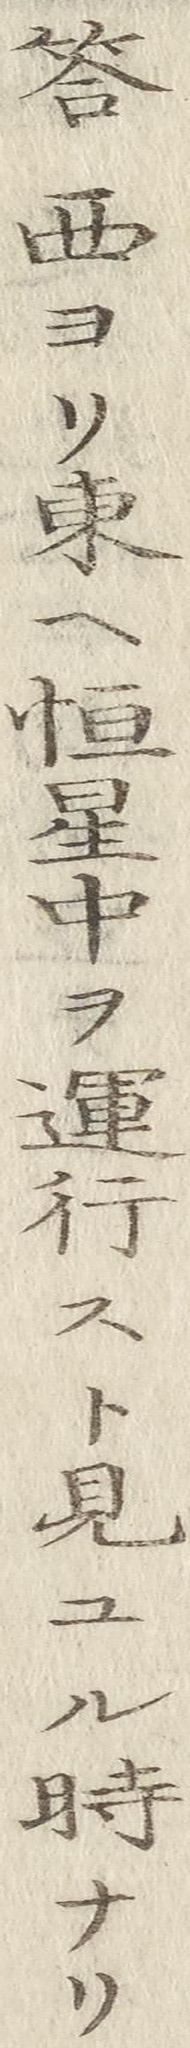答西ヨリ東ヘ恒星中ヲ運行スト見ユル時ナリ
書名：星学圖説　上
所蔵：東京大学地震研究所図書室 Earthquake Research Institute Library, The University of Tokyo, JAPAN
